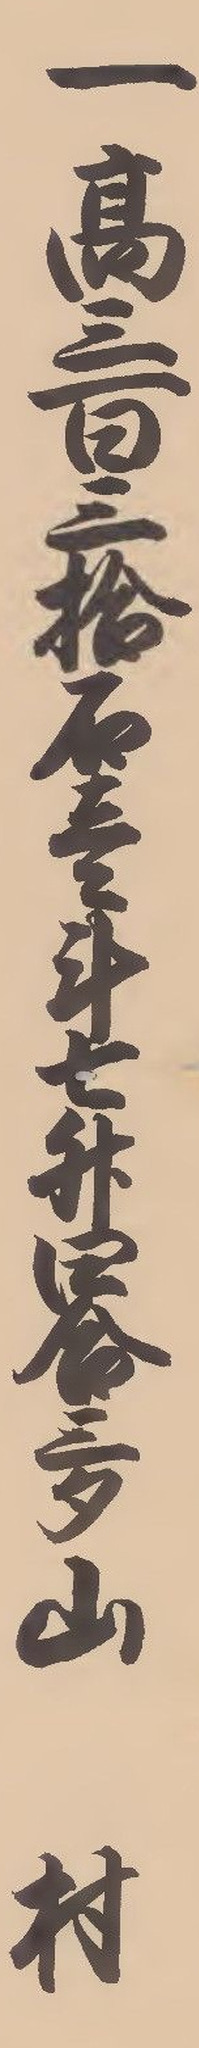一髙三百三拾石壱斗七升四合三夕山村
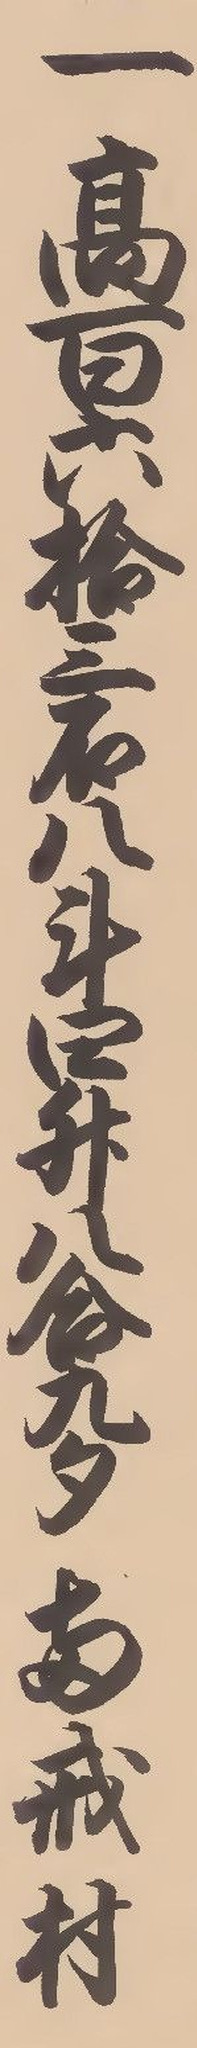一髙百六拾三石八斗四升八合九夕両戎村
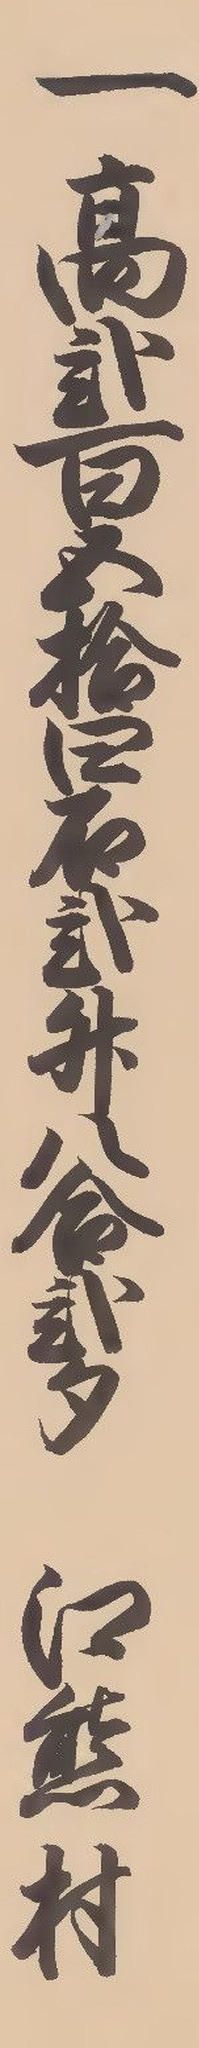一髙弐百五拾四石弐升八合弐夕江熊村
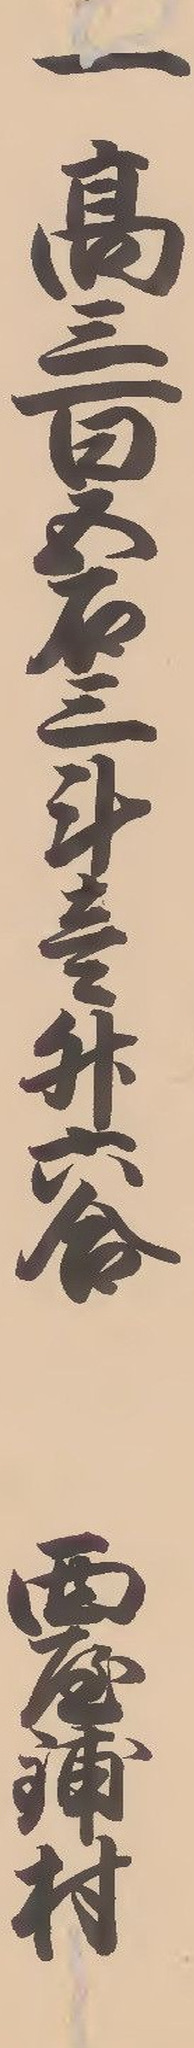一髙三百五石三斗壱升六合西屋鋪村
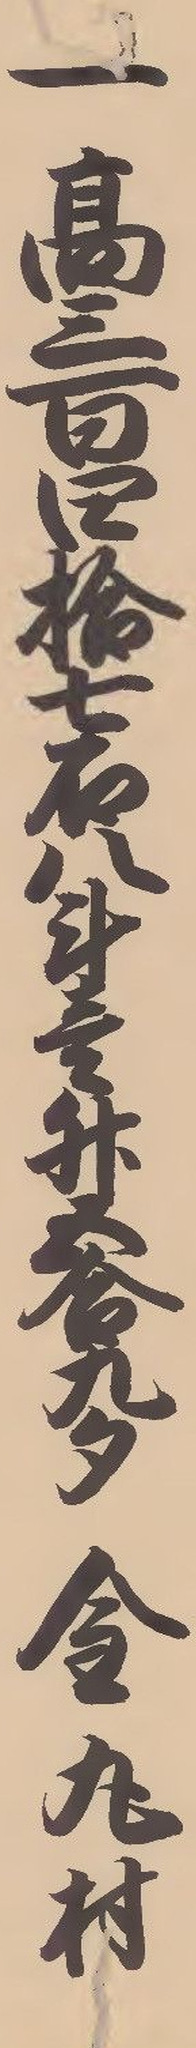一髙三百四拾七石八斗壱升五合九夕金丸村
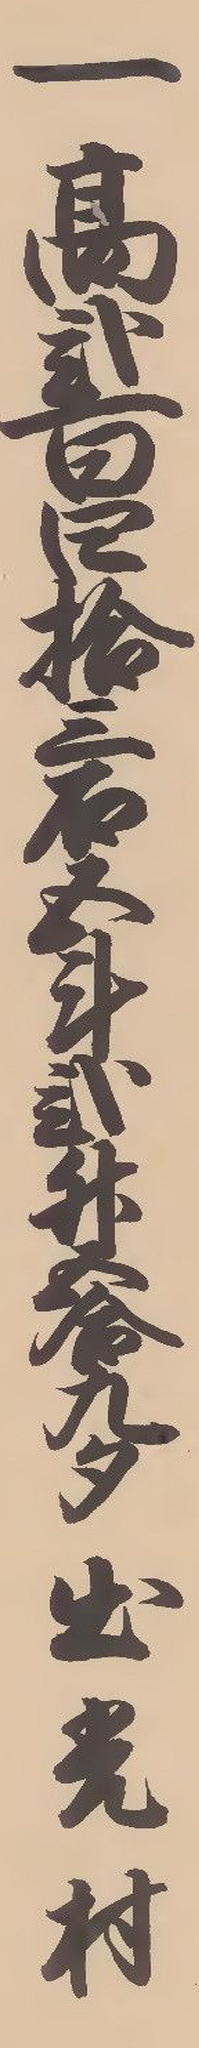一髙弐百四拾三石五斗弐升五合九夕出光村
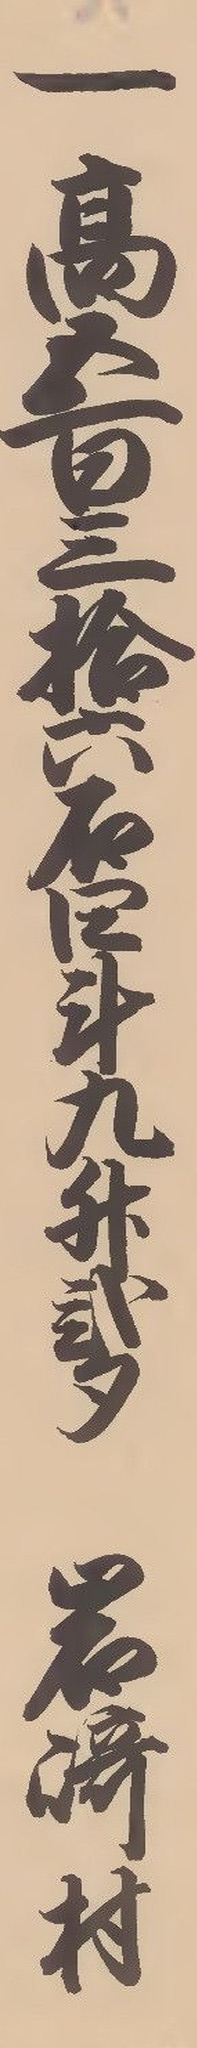一髙五百三拾六石四斗九升弐夕岩崎村
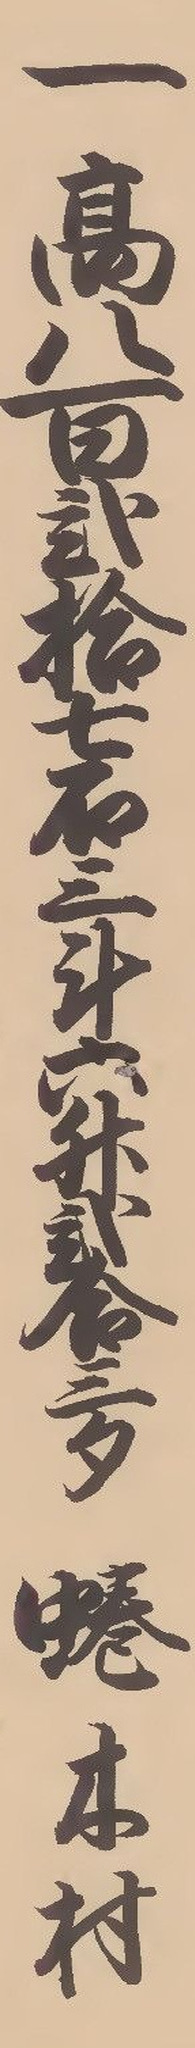一髙八百弐拾七石三斗六升弐合三夕蜷木村

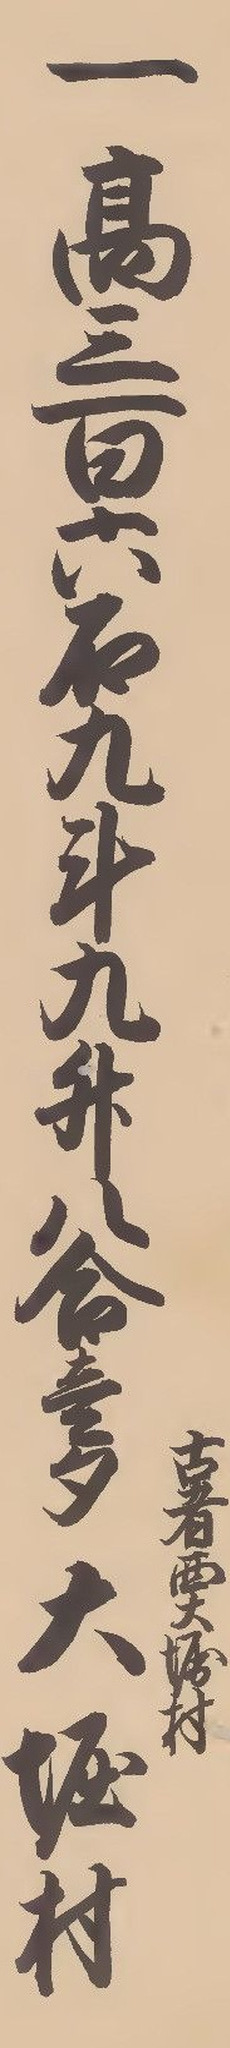一髙三百六石九斗九升八合壱夕大堀村
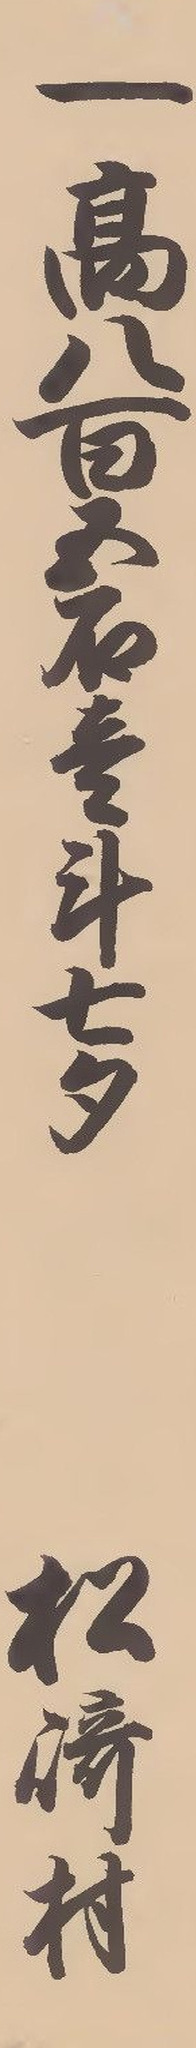一髙八百五石壱斗七夕松崎村
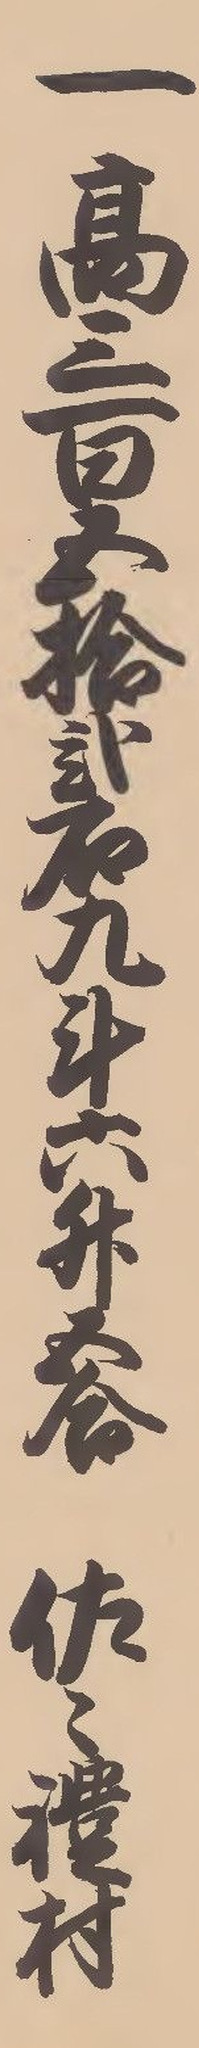一髙三百五拾に弐石九斗六升五合佐々禮村
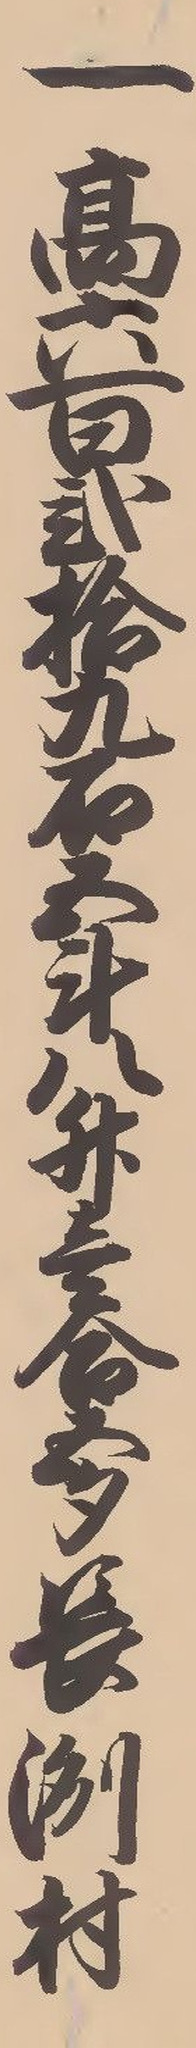一髙六百弐拾九石五斗八升壱合五夕長洲村
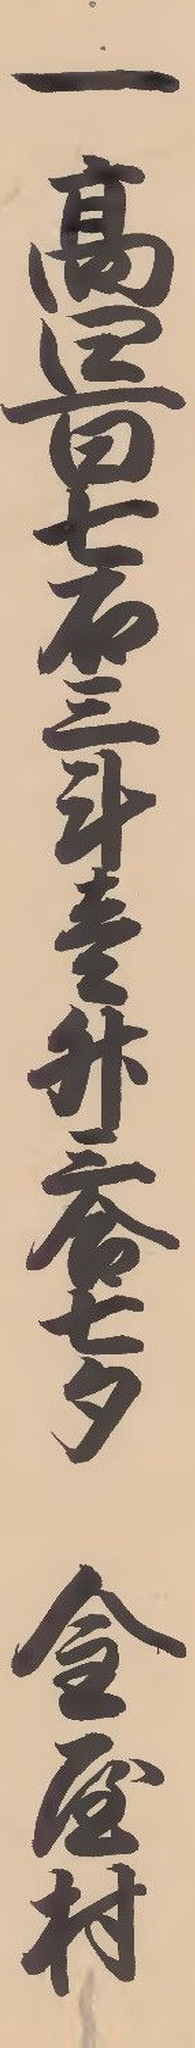一髙四百七石三斗壱升三合七夕金屋村
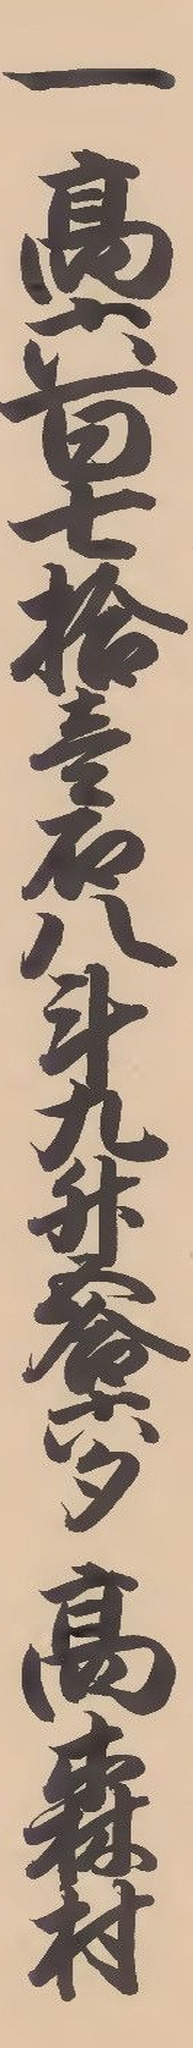一髙六百七拾壱石八斗九升五合六夕髙森村
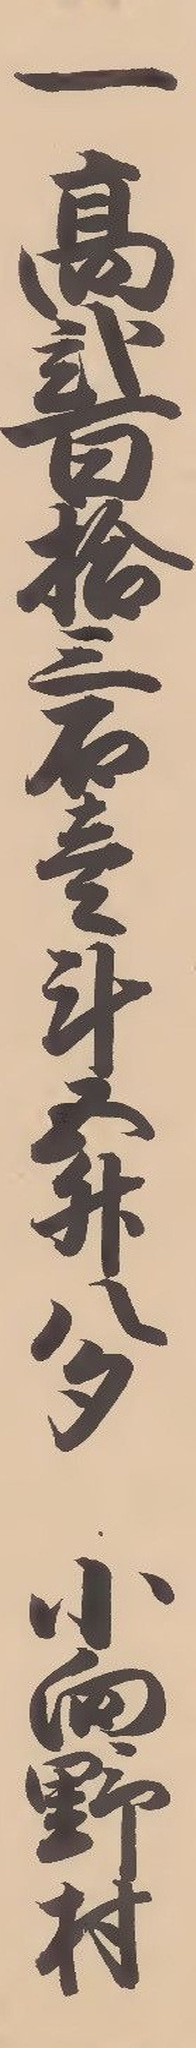一髙弐百拾三石壱斗五升八夕小向野村
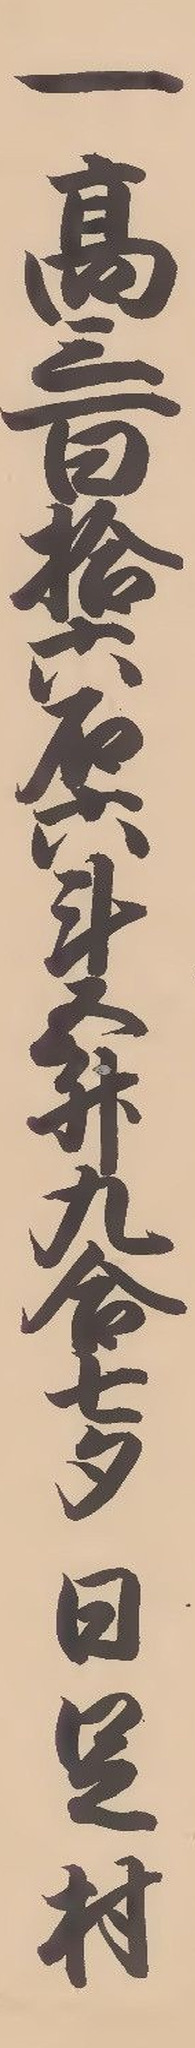一髙三百拾六石六斗五升九合七夕日足村
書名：豊前国郷帳
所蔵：国立公文書館 National Archives of Japan
